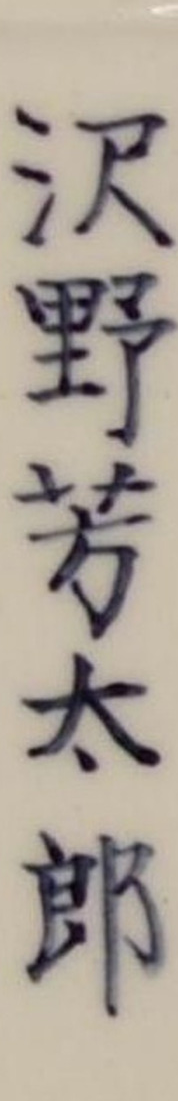沢野芳太郎
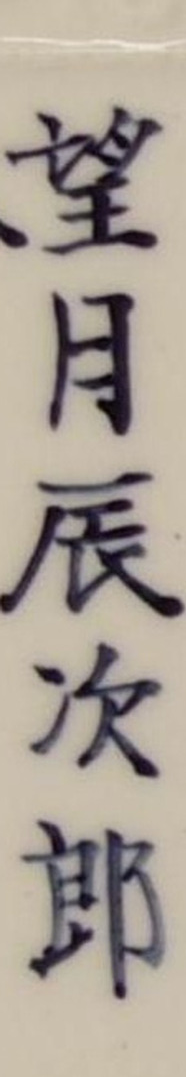望月辰次郎
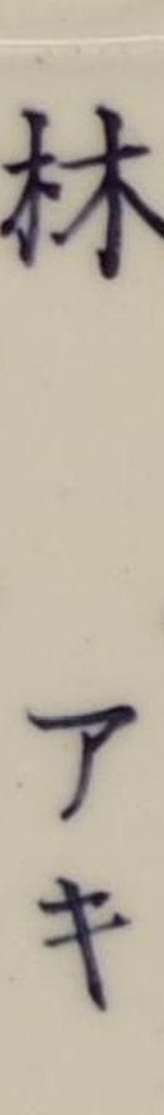林アキ
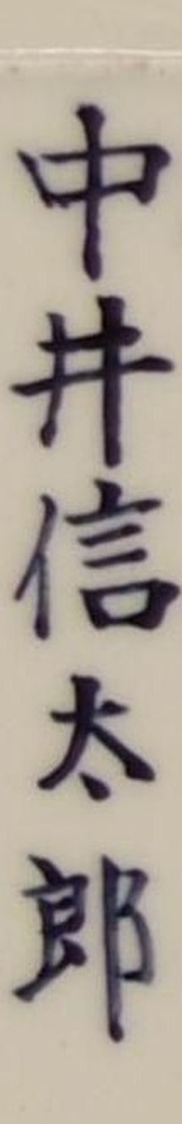中井信太郎
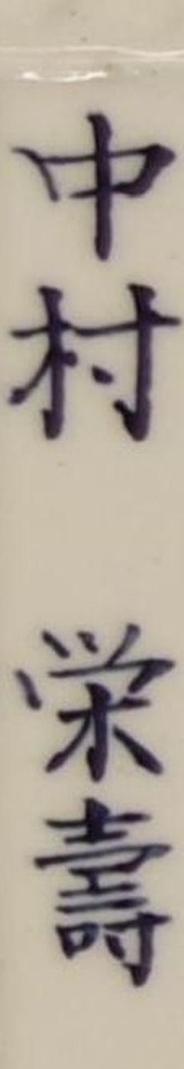中村栄壽

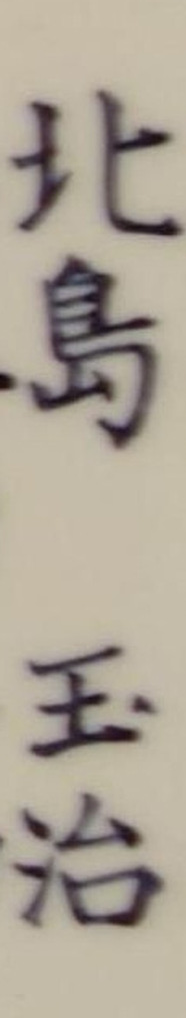北島玉治
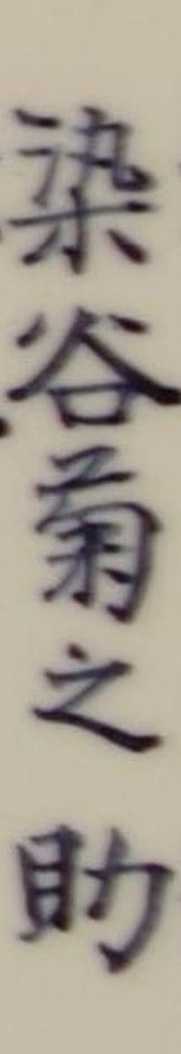染谷菊之助
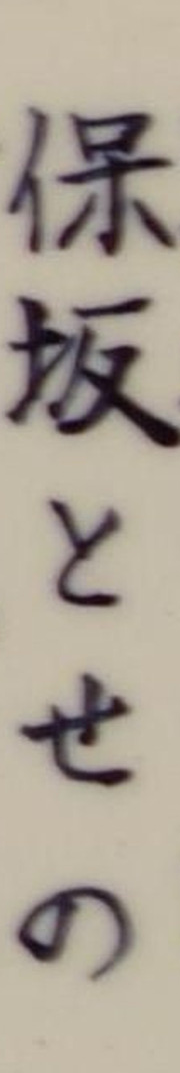保坂とせの
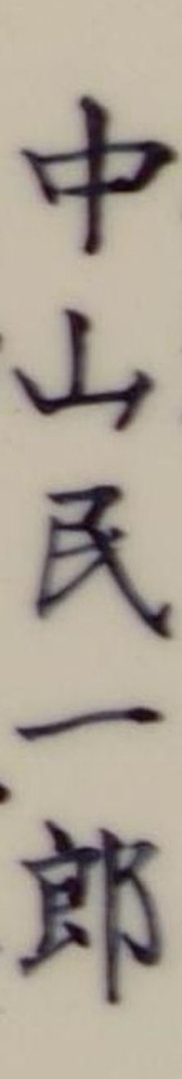中山民一郎
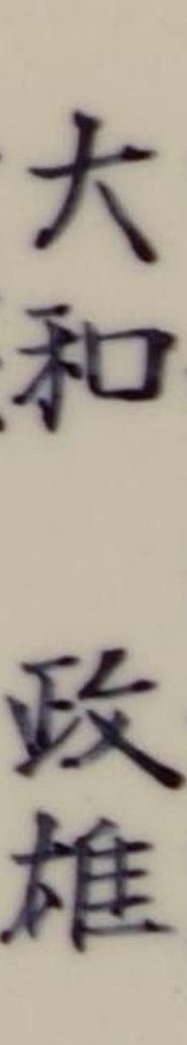大和政雄
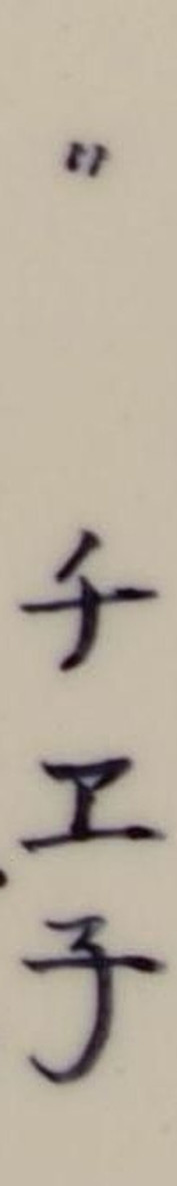チエ子
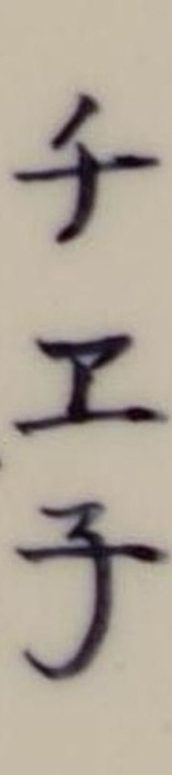チエ子
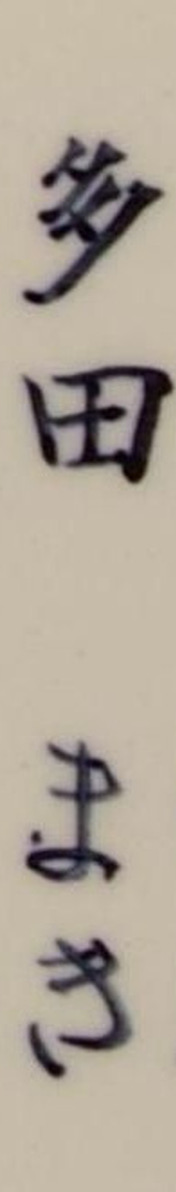多田まき
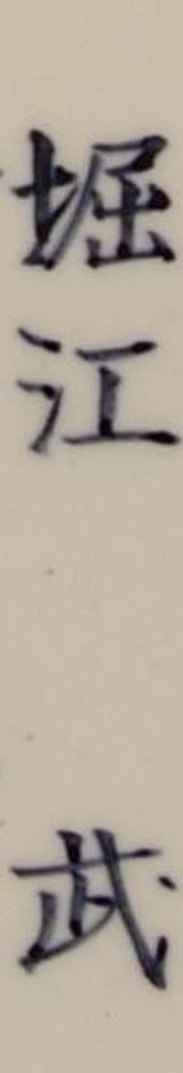堀江武
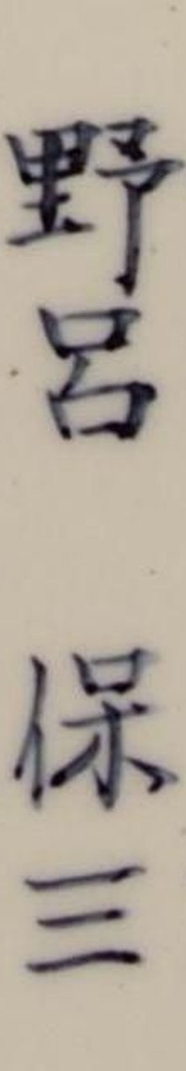野呂保三
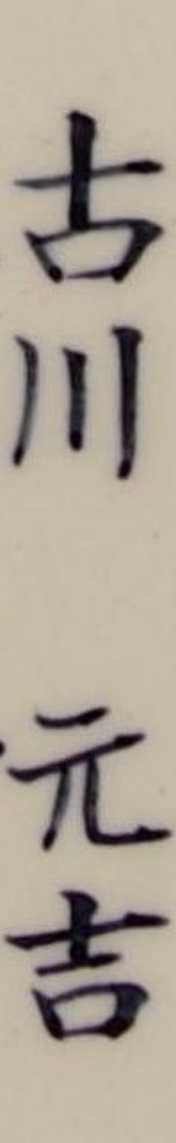古川元吉
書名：M~S
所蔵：高野山金剛峯寺
